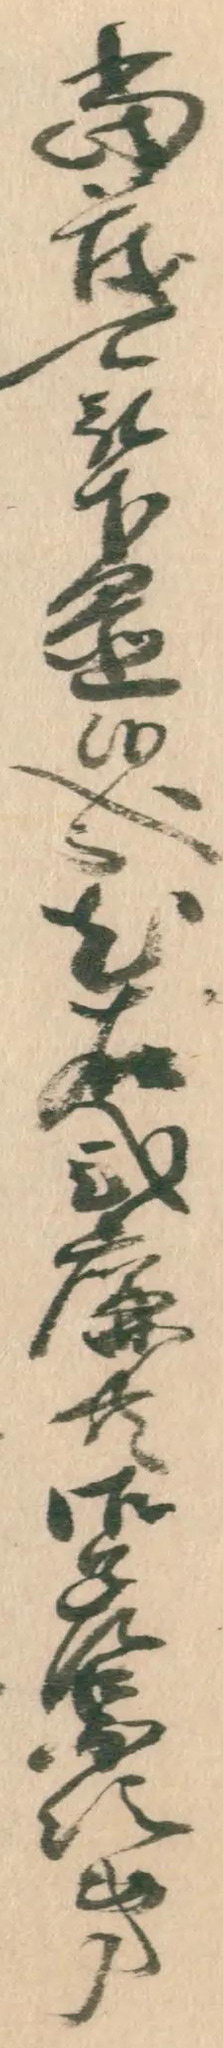当も可被下置候哉尤右弐廉共御差図次第
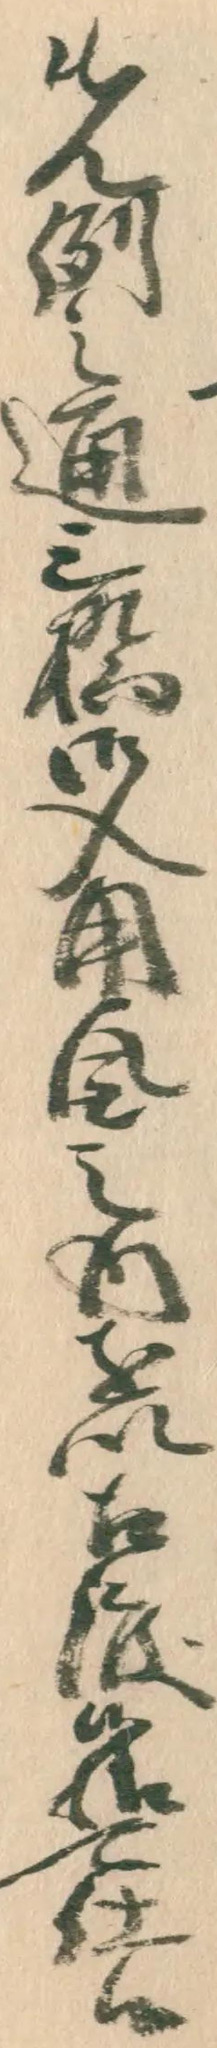先例之通三橋御入用金之内を以相渡候様可仕候
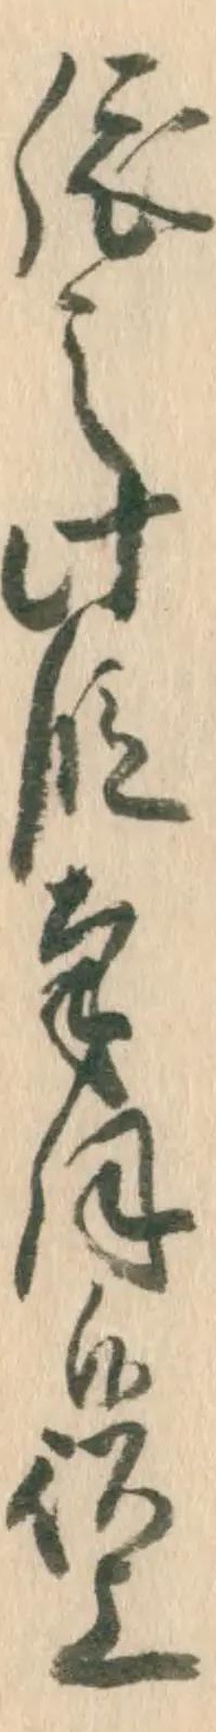依之此段奉伺候以上
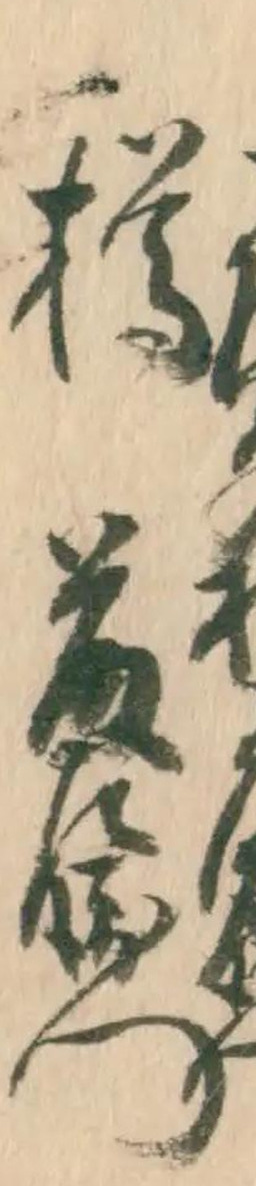樽藤左衛門

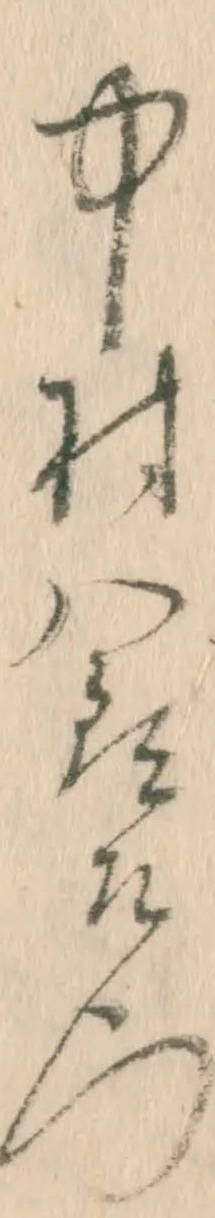中村八郎左衛門
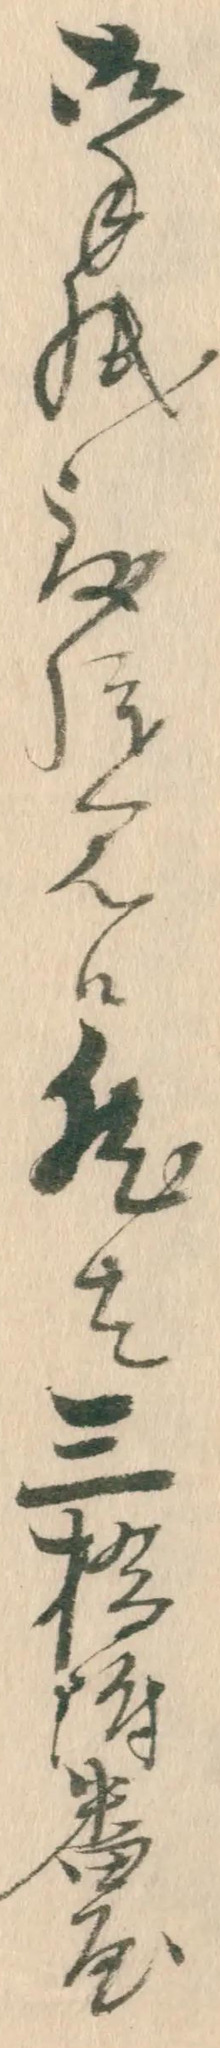御手紙致拝見候然は三橋附番屋
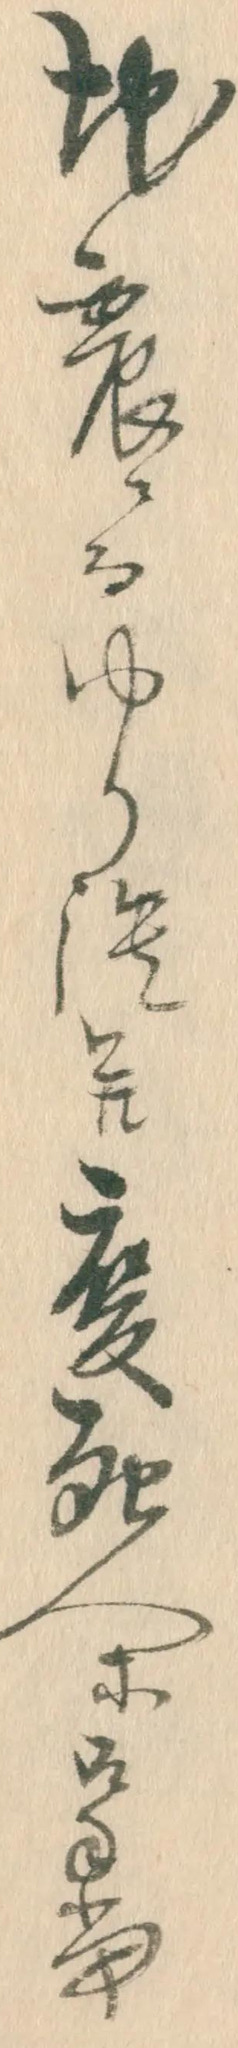地震ニ而ゆり潰并変死人等御手当
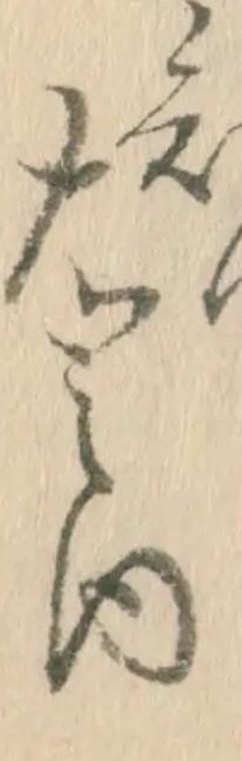右之内

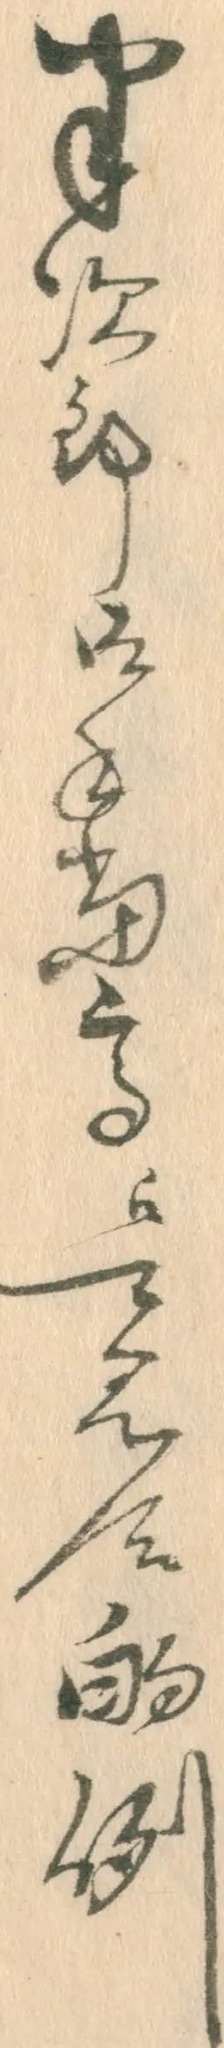半次郎御手当高え可見合的例
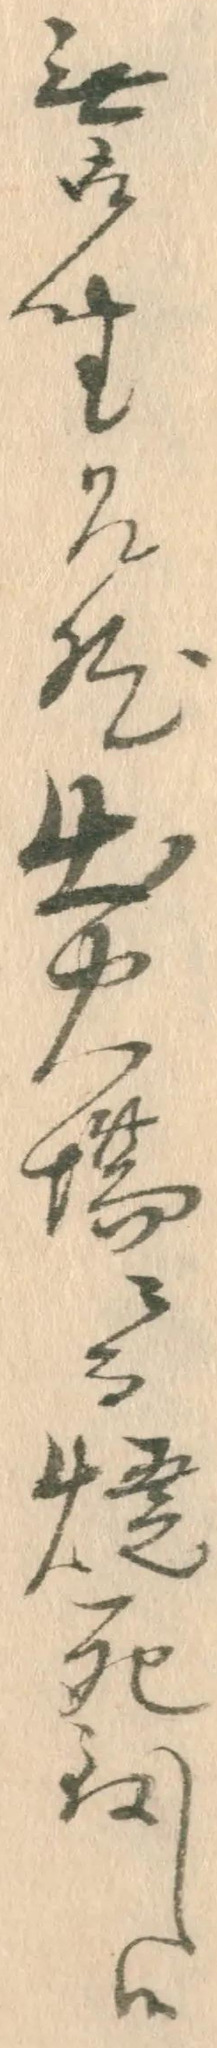無御坐候乍然出火場ニ而焼死致し候
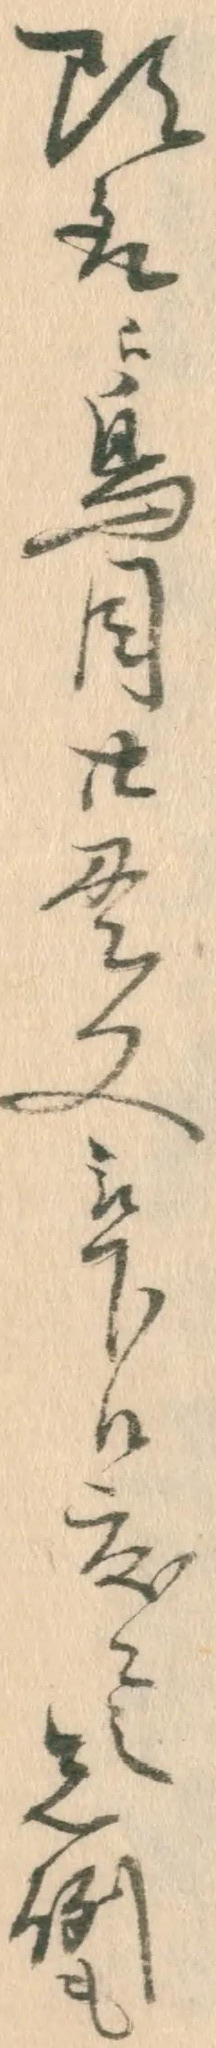頭取え鳥目廿貫文被下候度々之先例も
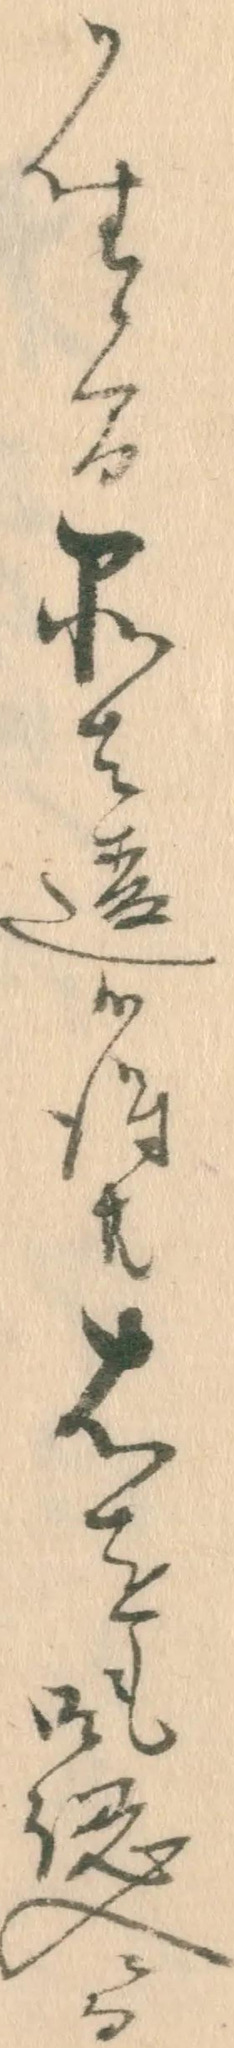御坐候間品は違候得共右をも御認入ニ而
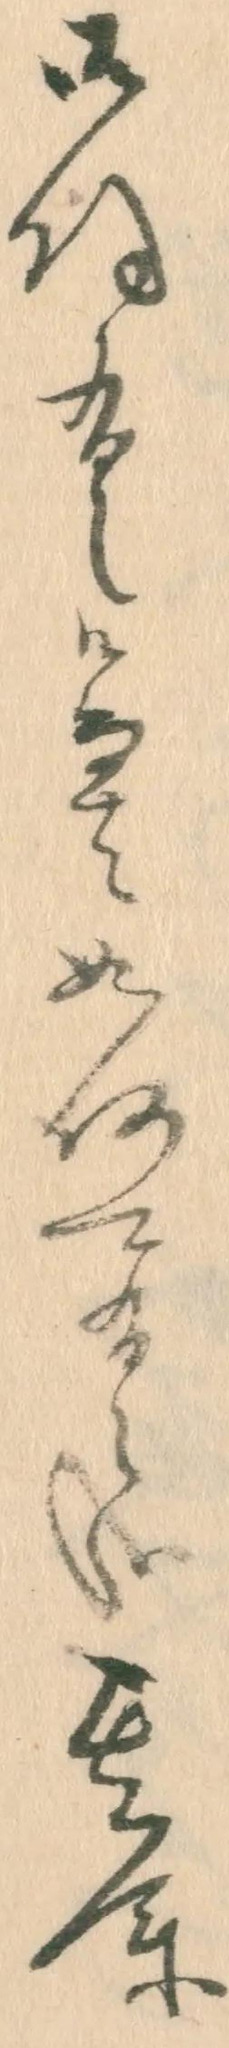御伺有之候而は如何可有之哉其余
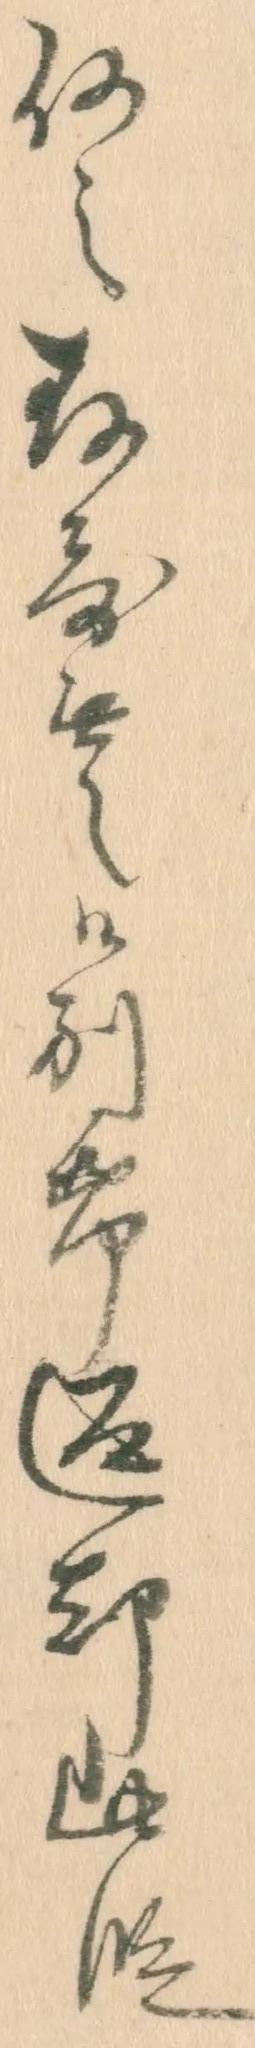何之存寄無之候別紙返却此段
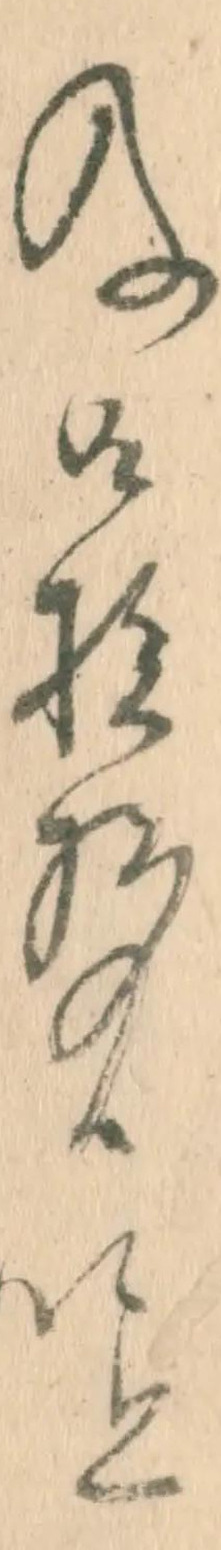及御挨拶候以上
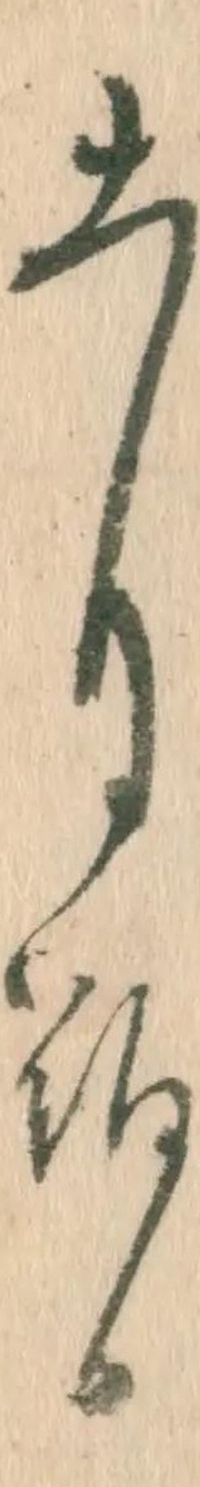十一月朔日
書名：三橋 17巻. [8] 三橋小破御修復書留　但御奉行御掛リ替地震潰橋番屋　嘉永四亥年より安政二卯年迄　下
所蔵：国立国会図書館 National Diet Library, JAPAN
